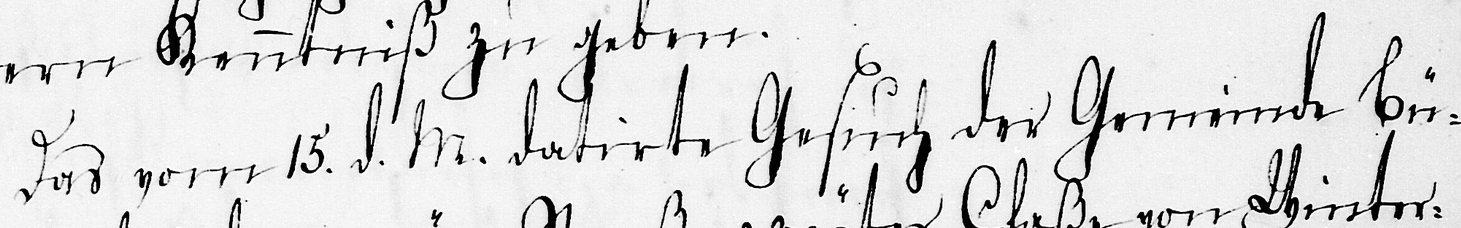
Das vom 15. d. M. datirte Gesuch der Gemeinde Bü¬
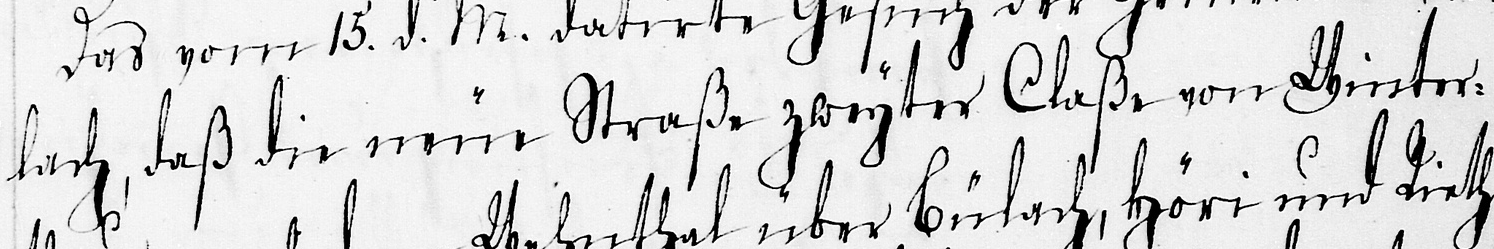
lach, daß die neue Straße zweyter Claße von Winter¬
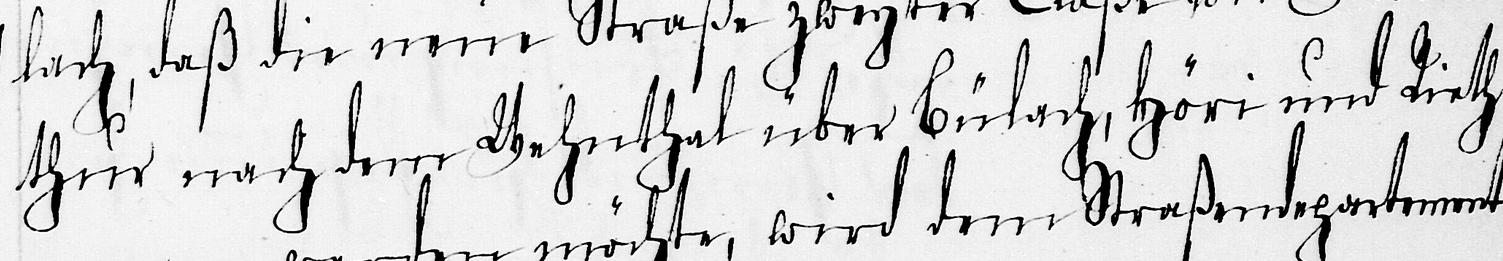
thur nach dem Wehnthal über Bülach, Höri und Rieth
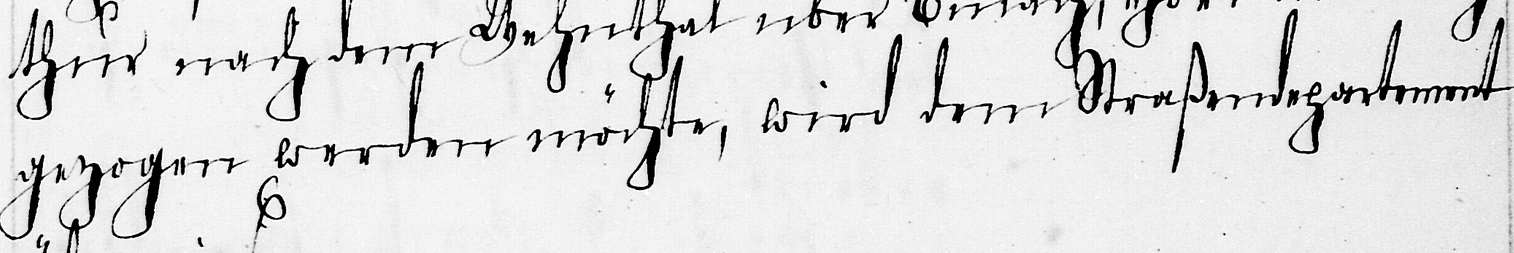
gezogen werden möchte, wird dem Straßendepartement
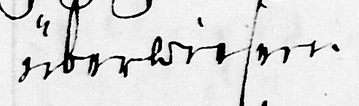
überwiesen.
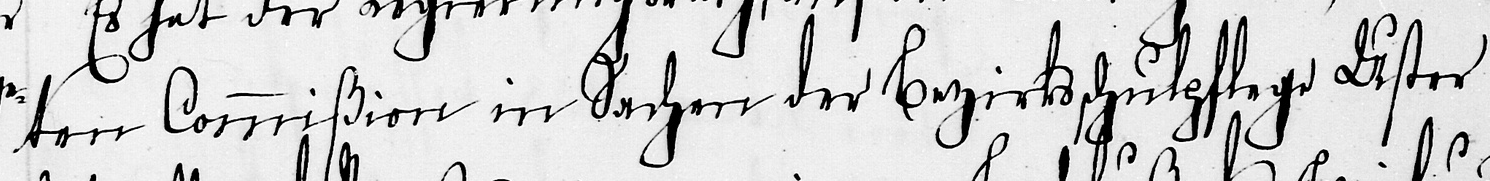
ten Commißion in Sachen der Bezirksschulpflege Uster
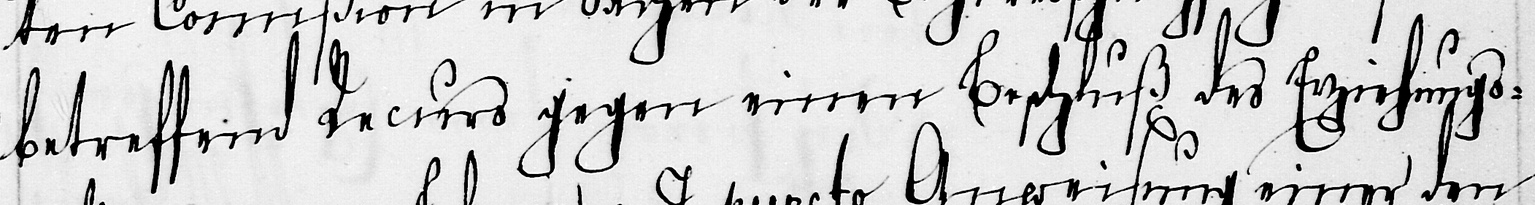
betreffend Recurs gegen einen Beschluß des Erziehungs¬
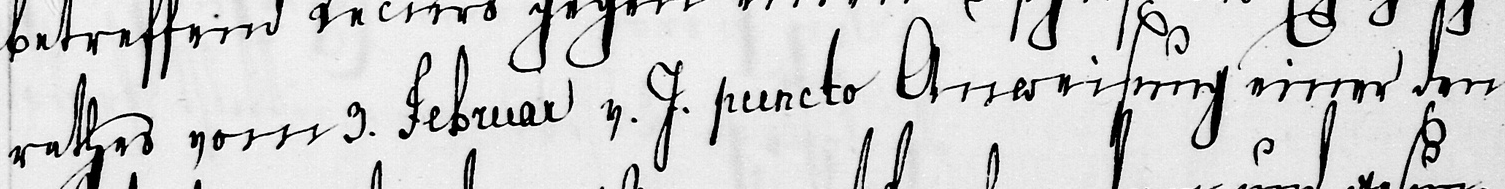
rathes vom 9. Februar v. J. puncto Anweisung einer den
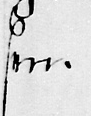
Die¬
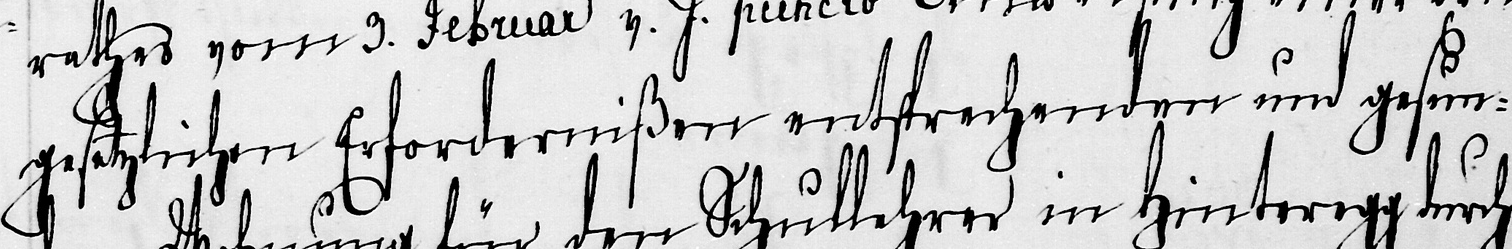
gesetzlichen Erfordernißen entsprechenden und gesun¬
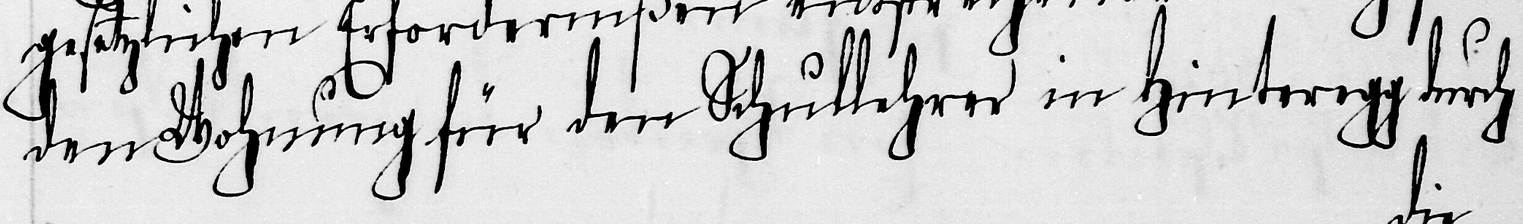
den Wohnung für den Schullehrer in Hinteregg durch
